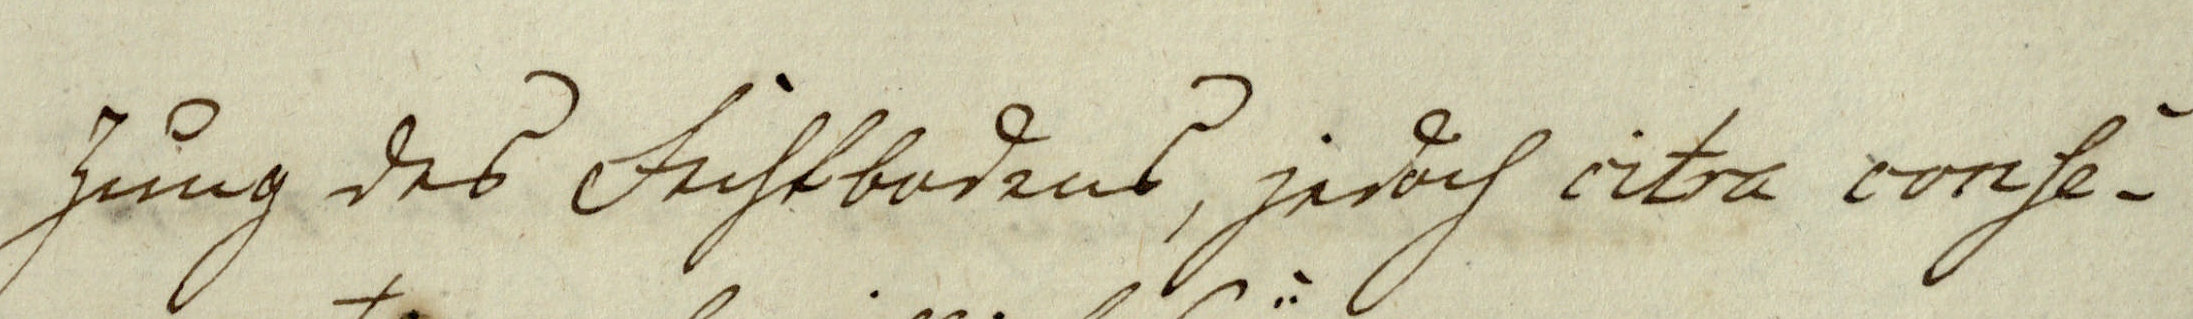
zung des Fechtbodens, jedoch citra conse¬
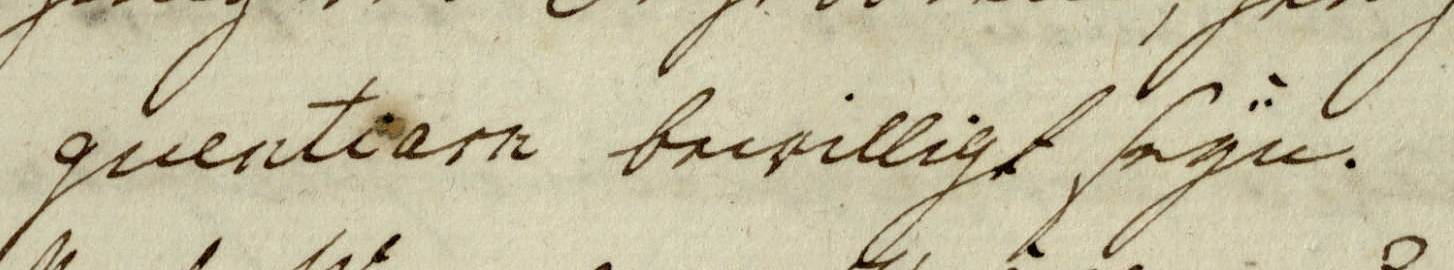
quentiam bewilligt seÿn.
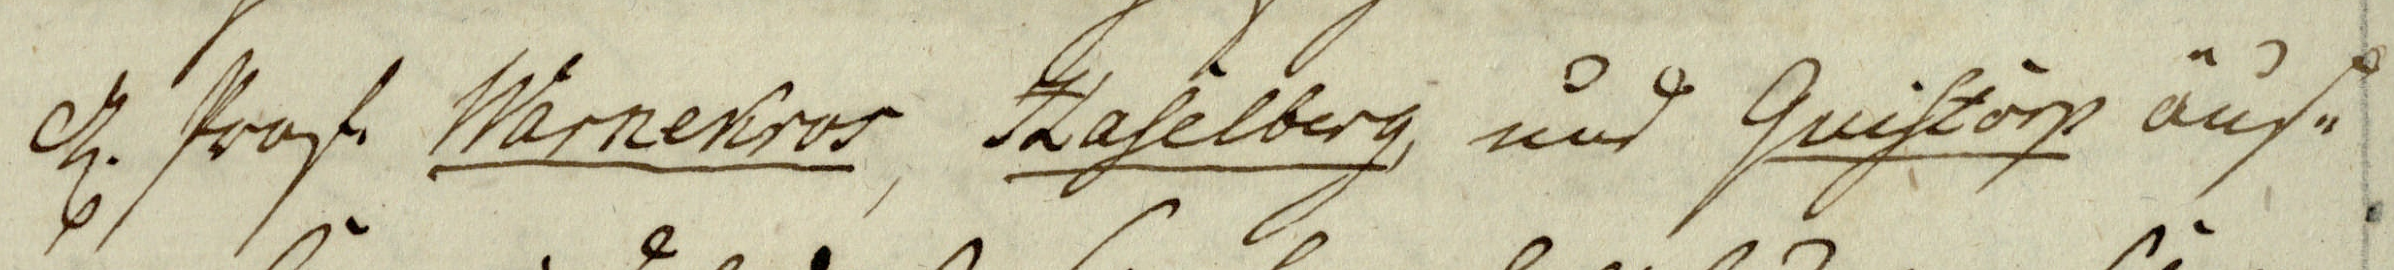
dh. Prof. Warneckros, Haselberg und Quistorp äus¬
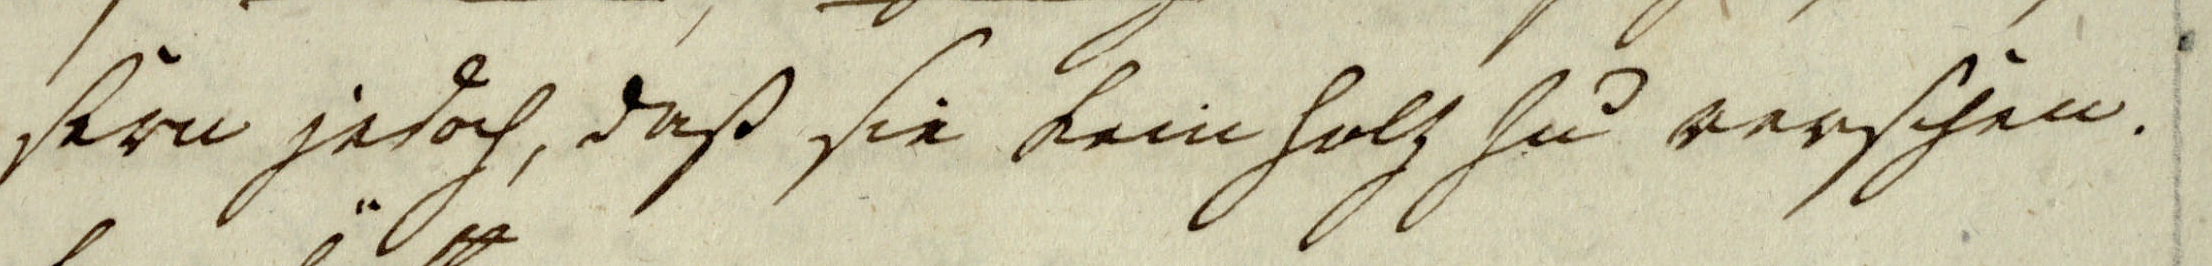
sern jedoch, daß sie kein Holz zu verschen¬
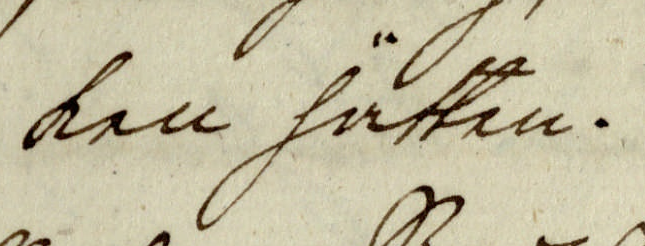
ken hätten.
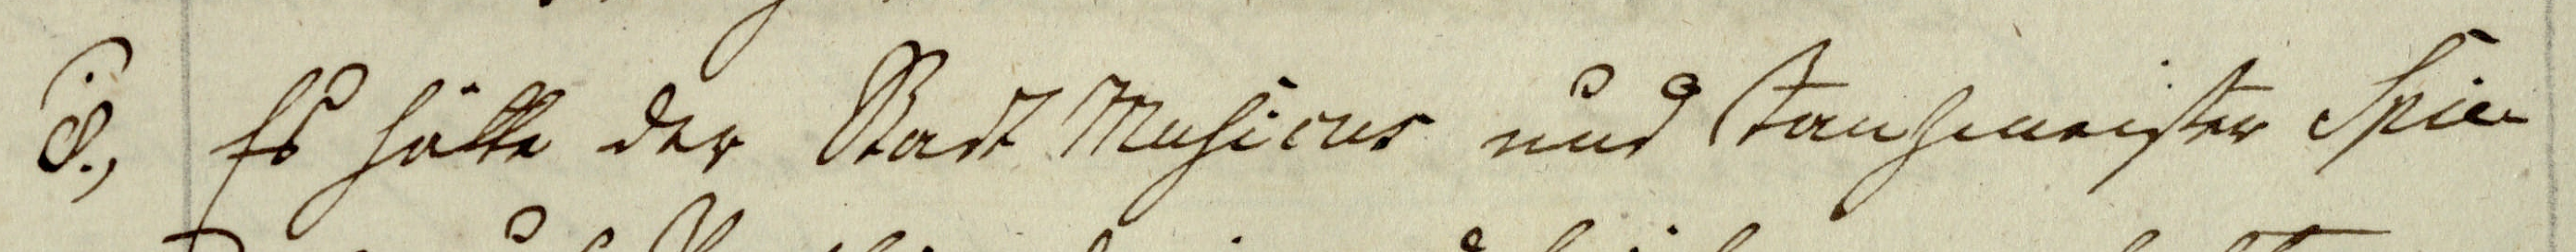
8., Es hätte der Stadt Musicus und Tanzmeister Spie¬
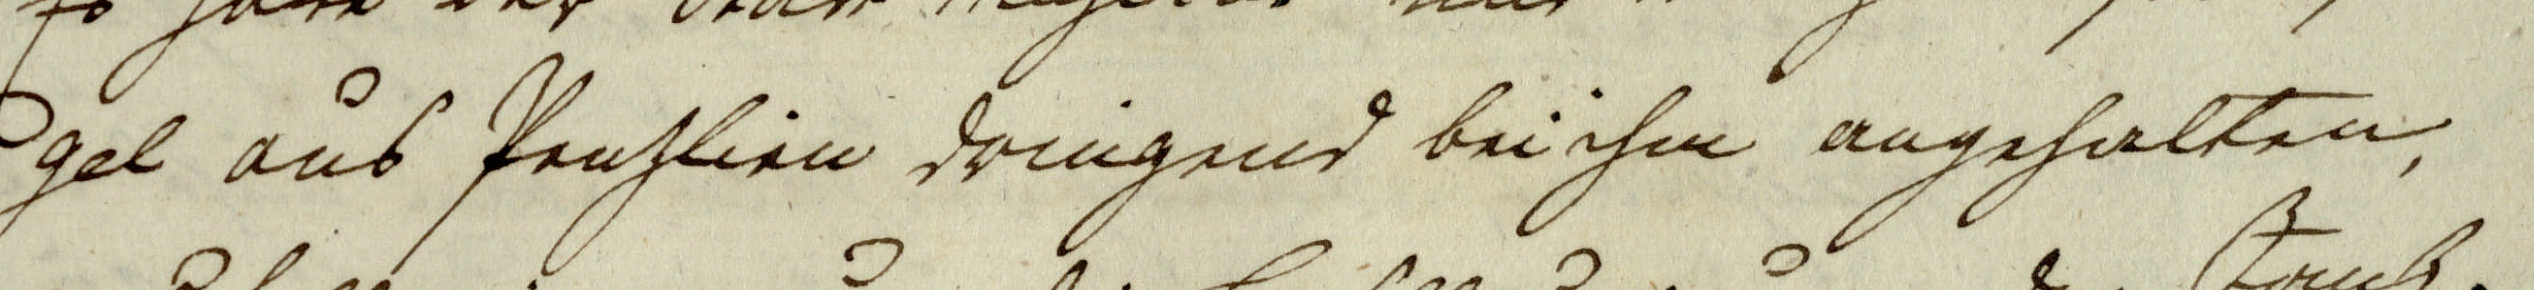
gel aus Penzlien dringend bei ihm angehalten,
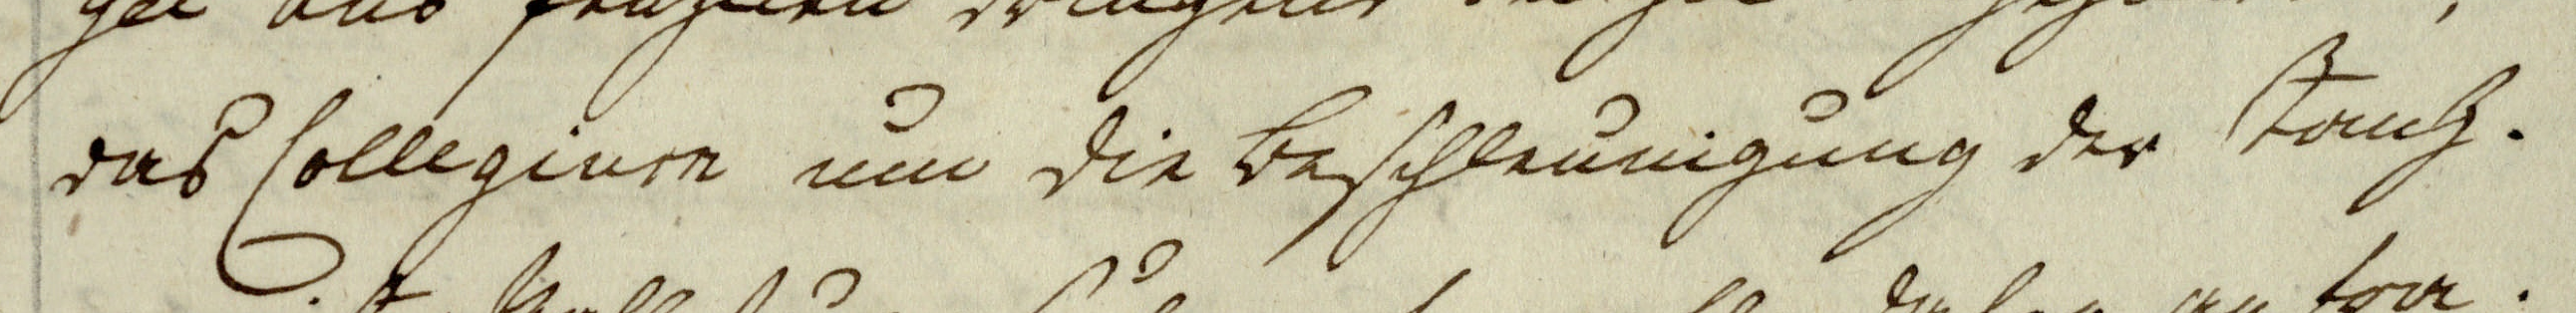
das Collegium um die Beschleunigung der Tanz¬
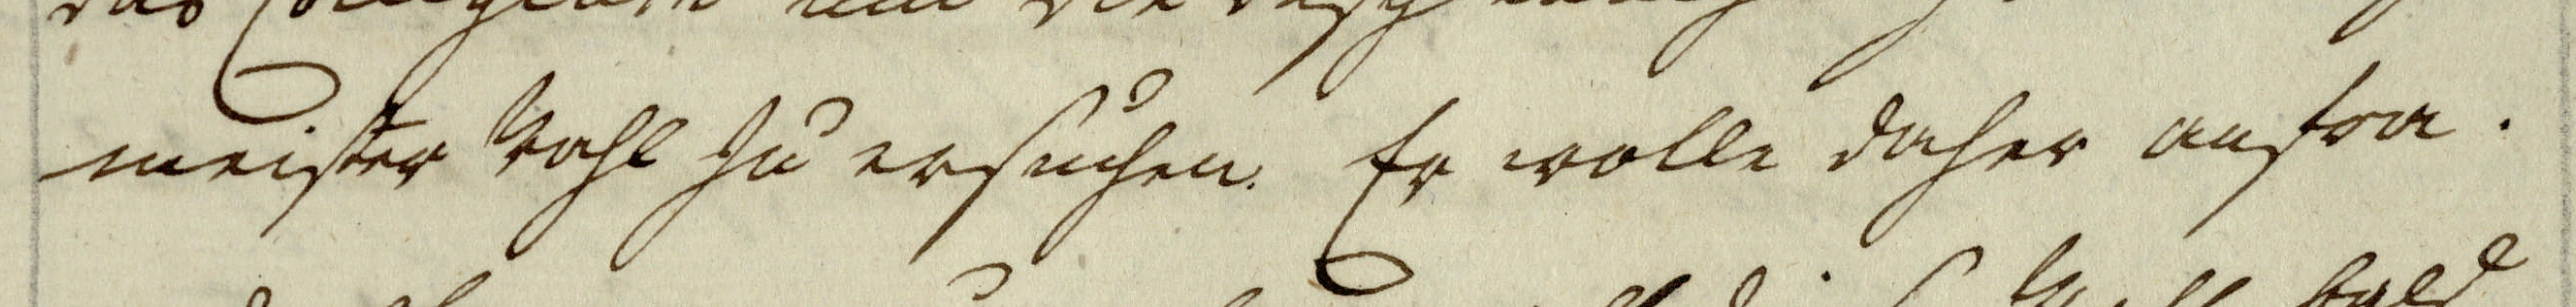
meister Wahl zu ersuchen. Er wolle daher anfra¬
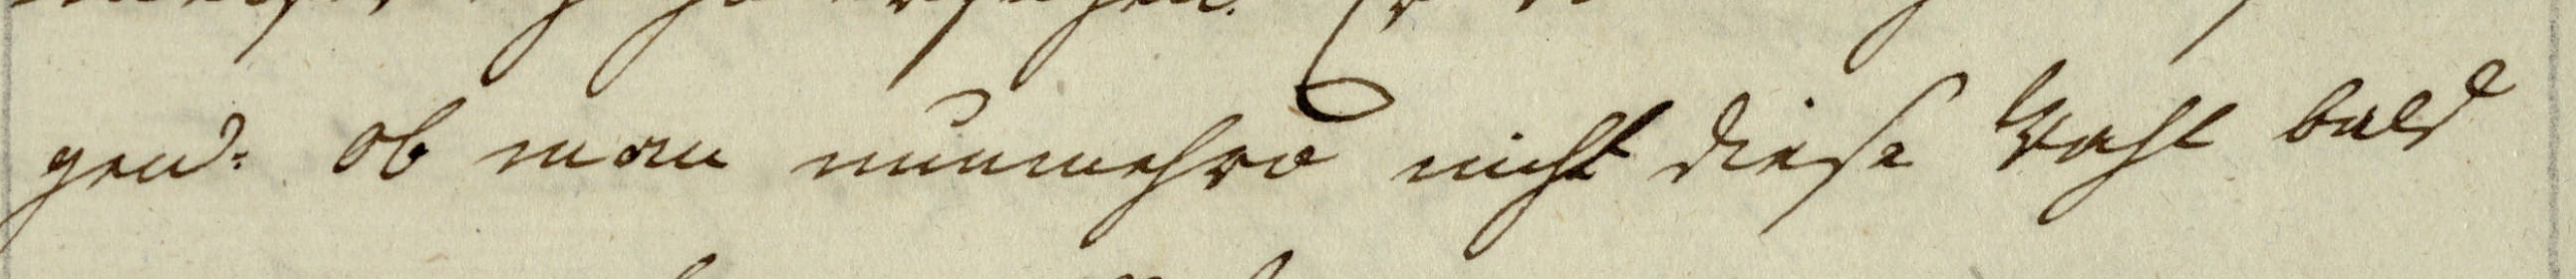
gen: ob man nunmehro nicht diese Wahl bald
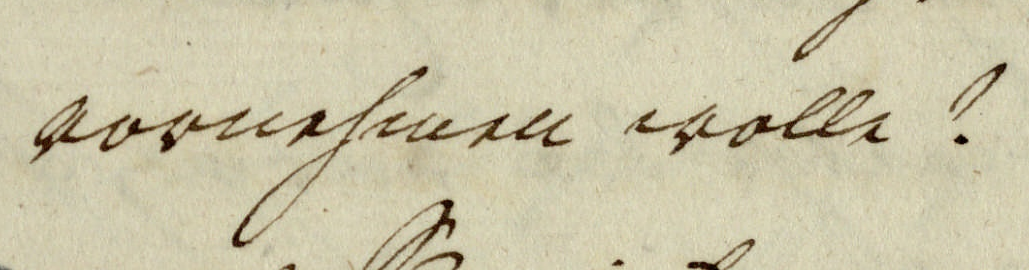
vornehmen wolle?
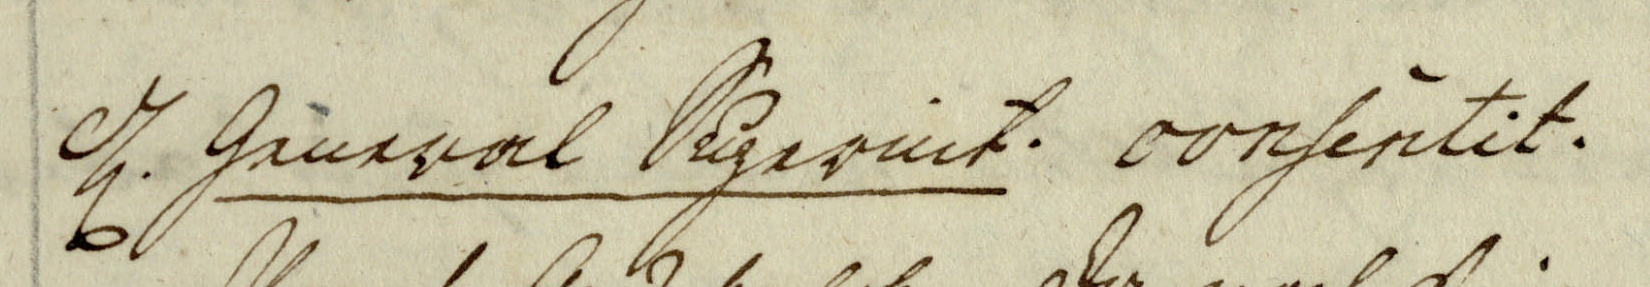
dh. General Superint. consentit.
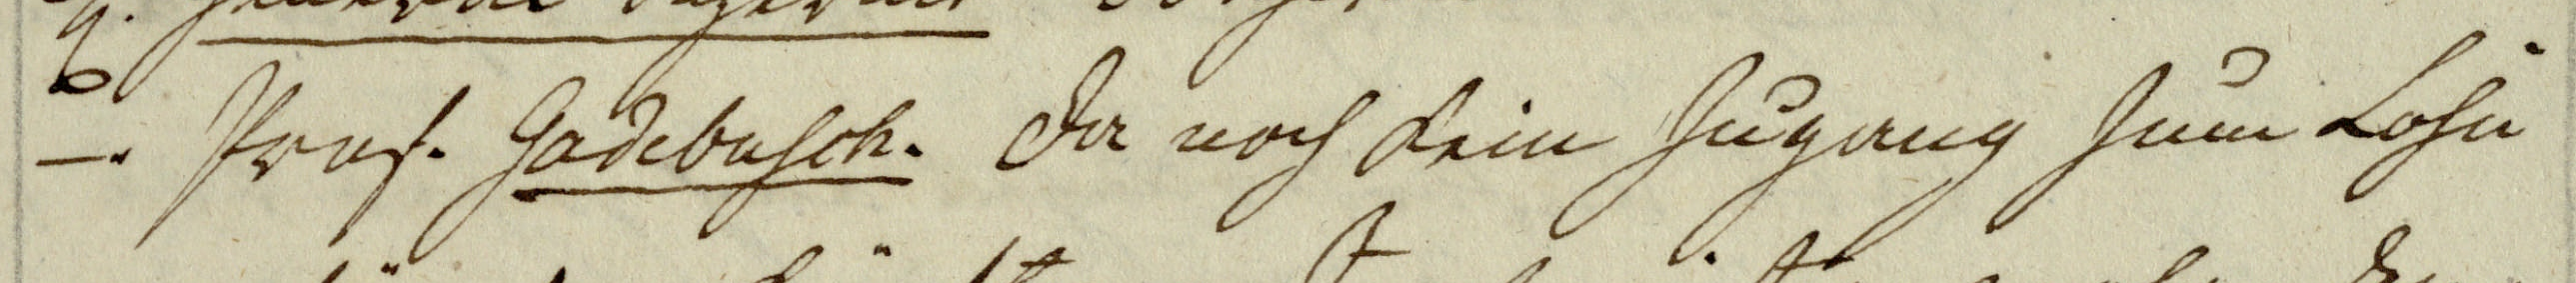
Prof. Gadebusch. Da noch kein Zugang zum Lohn
